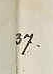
37.
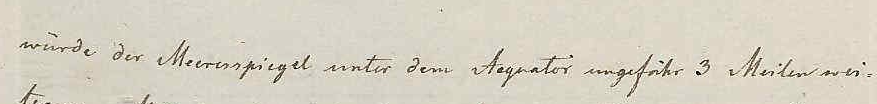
würde der Meeresspiegel unter dem Aequator ungefähr 3 Meilen wei-
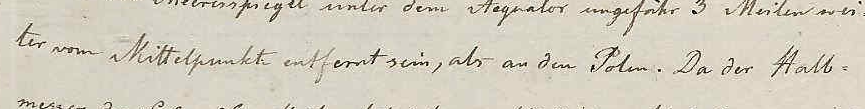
ter vom Mittelpunkte entfernt sein, als an den Polen. Da der Halb-
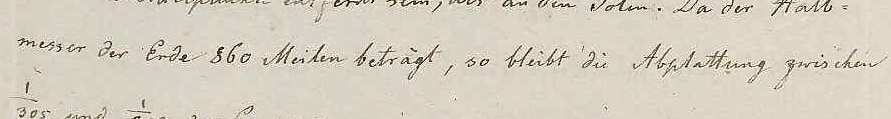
messer der Erde 860 Meilen beträgt, so bleibt die Abplattung zwischen
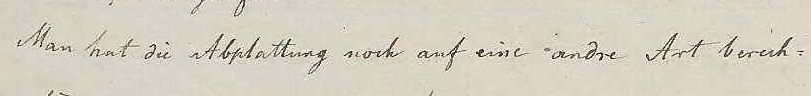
Man hat zu die Abplattung noch auf eine andre Art berech-
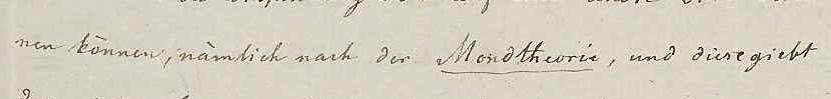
nen können, nämlich nach der Mondtheorie, und diese giebt
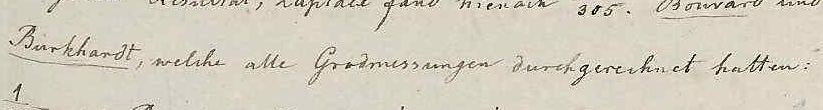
Burkhardt, welche alle Gradmessungen durchgerechnet hatten:
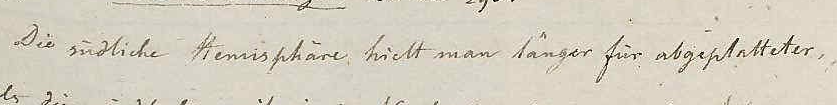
Die südliche Hemisphäre hielt man länger für abgeplatteter,
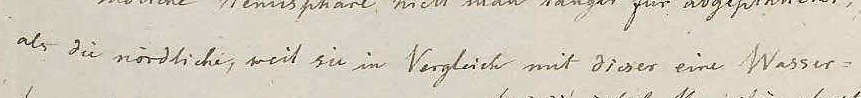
als die nördliche, weil sie in Vergleich mit dieser eine Wasser-
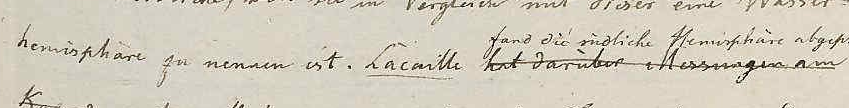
hemisphäre zu nennen ist. Lacaille hat darüber Messungen amfand
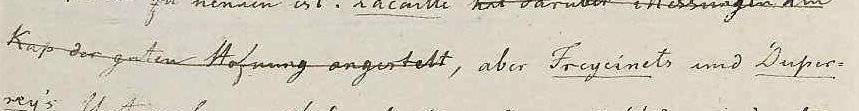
Kap der guten Hofnung angestelt, aber Freycinets und Duper-
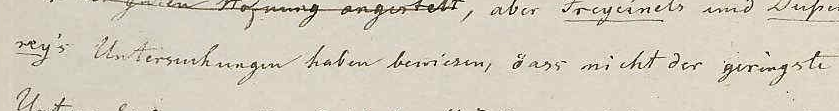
rey's Untersuchungen haben bewiesen, dass nicht der geringste
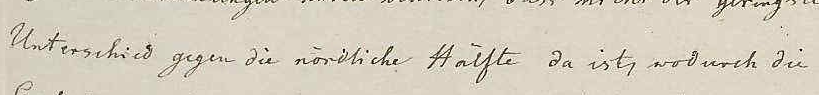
Unterschied gegen die nördliche Hälfte da ist, wodurch die
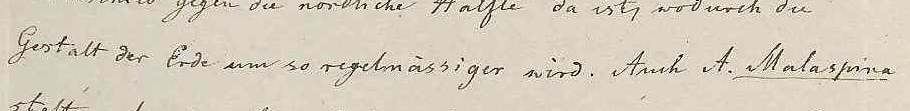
Gestalt der Erde um so regelmässiger wird. Auch A. Malaspina
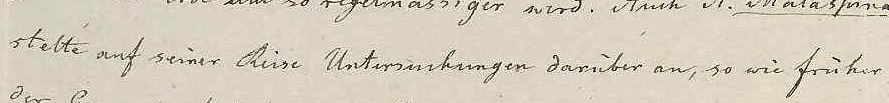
stelte auf seiner Reise Untersuchungen darüber an, so wie früher
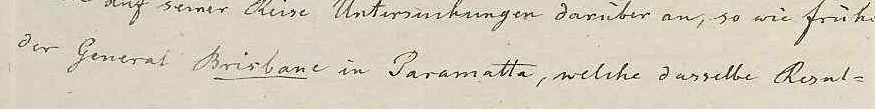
der General Brisbane in Paramatta, welche dasselbe Resul-
